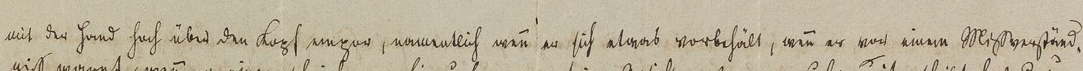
mit der Hand hoch über den Kopf empor, namentlich wenn er sich etwas vorbehält, wenn er vor einem Mißverständ-
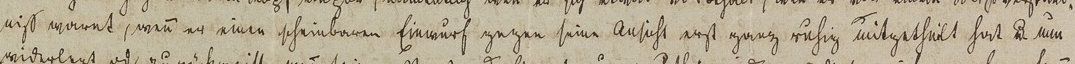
niß warnt, wenn er einen scheinbaren Einwurf gegen seine Ansicht erst ganz ruhig mitgetheilt hat u. nun
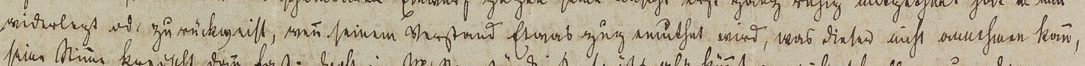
widerlegt od. zurückweist, wenn seinem Verstand Etwas zugemuthet wird, was dieser nicht annehmen kann,
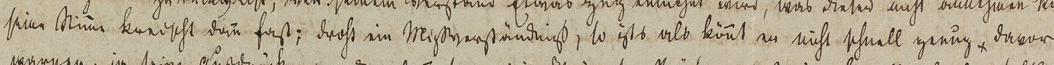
seine Stimme kreischt dann fast; droht ein Mißverständniß, so ists als könnt er nicht schnell genug davor
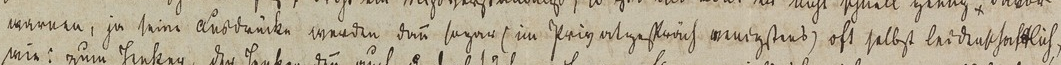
warnen, ja seine Ausdrücke werden dann sogar (im Privatgespräch wenigstens) oft selbst leidenschaftlich,
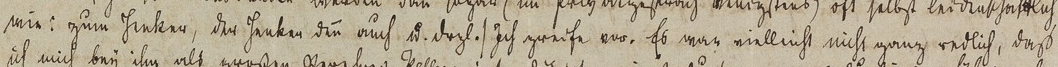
wie: zum Henker, der Henker denn auch u. drgl. Ich greife vor. Es war vielleicht nicht ganz redlich, daß
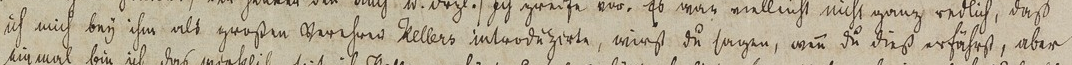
ich mich bey ihm als großen Verehrer Kellers introduzirte, wirst du sagen, wenn du dieß erfährst, aber
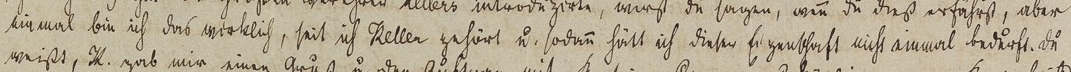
einmal bin ich das wirklich, seit ich Keller gehört u. sodann hätt ich dieser Eigenschaft nicht einmal bedurft. Du
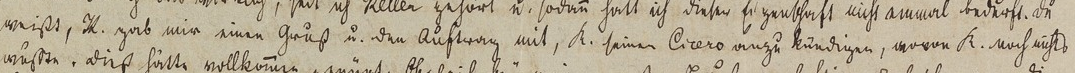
weißt, K. gab mir einen Gruß u. den Auftrag mit, R. seinen Cicero anzukündigen, wovon R. noch nichts
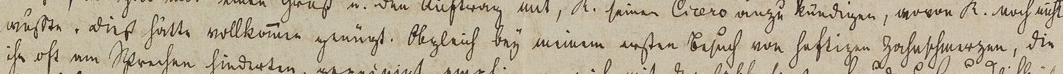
wußte. Dieß hätte vollkommen genügt. Obgleich bey meinem ersten Besuch von heftigen Zahnschmerzen, die
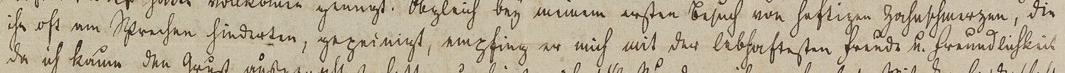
ihn oft am Sprechen hinderten, gepeinigt, empfing er mich mit der lebhaftesten Freude u. Freundlichkeit
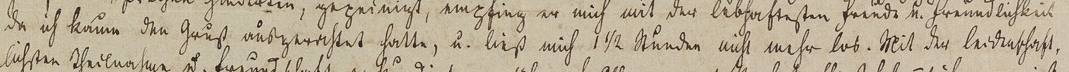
da ich kaum den Gruß ausgerichtet hatte, u. ließ mich 1½ Stunden nicht mehr los. Mit der leidenschaft-
